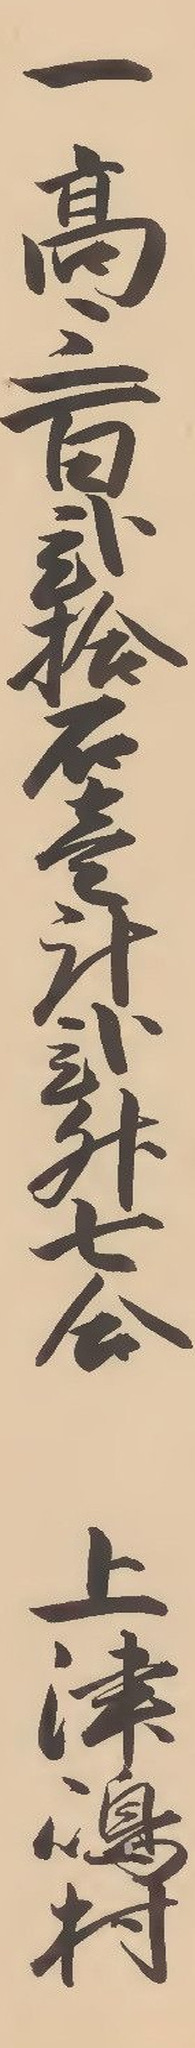一高三百弐拾石壱斗弐升七合上津島村

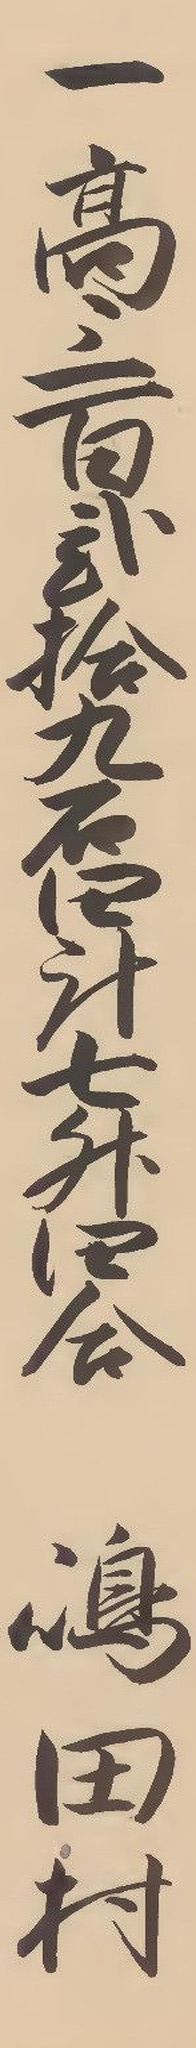一高三百弐拾九石四斗七升四合島田村
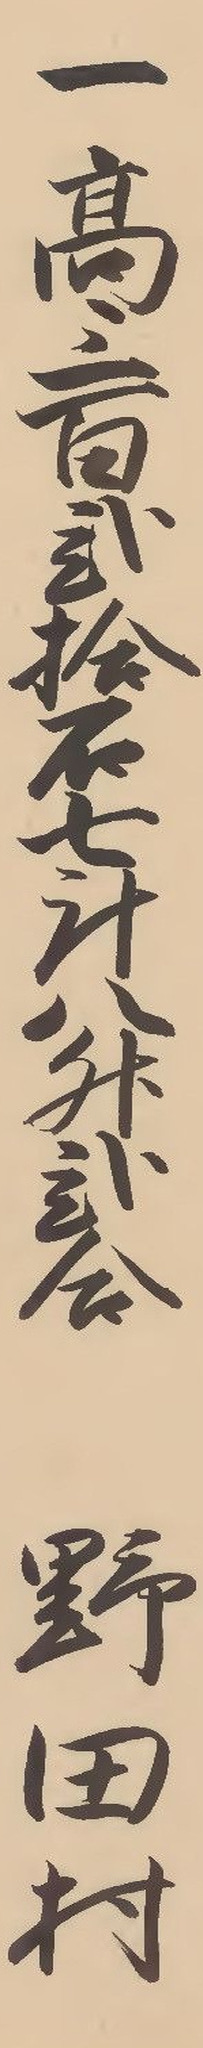一高三百弐拾石七斗八升弐合野田村
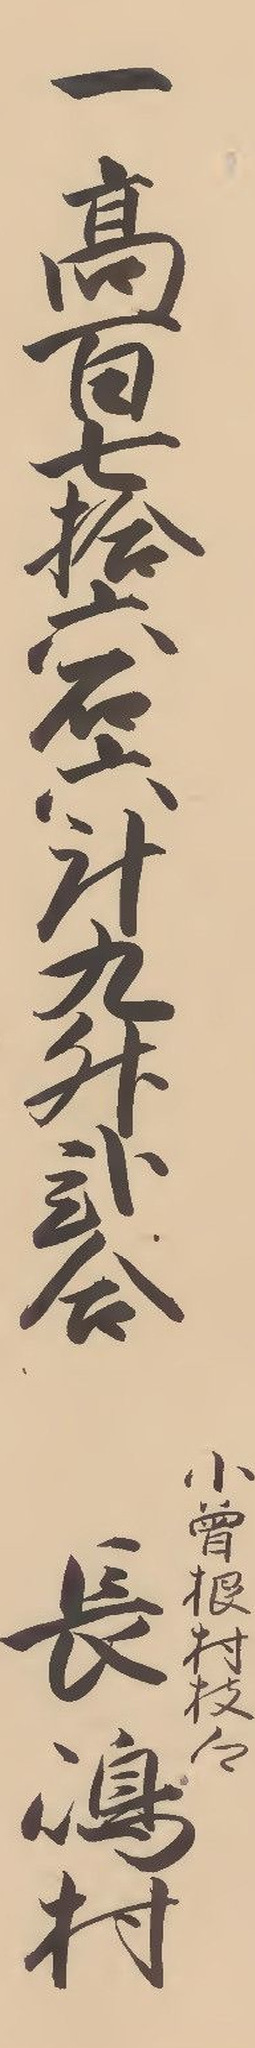一高百七拾六石六斗九升弐合長島村
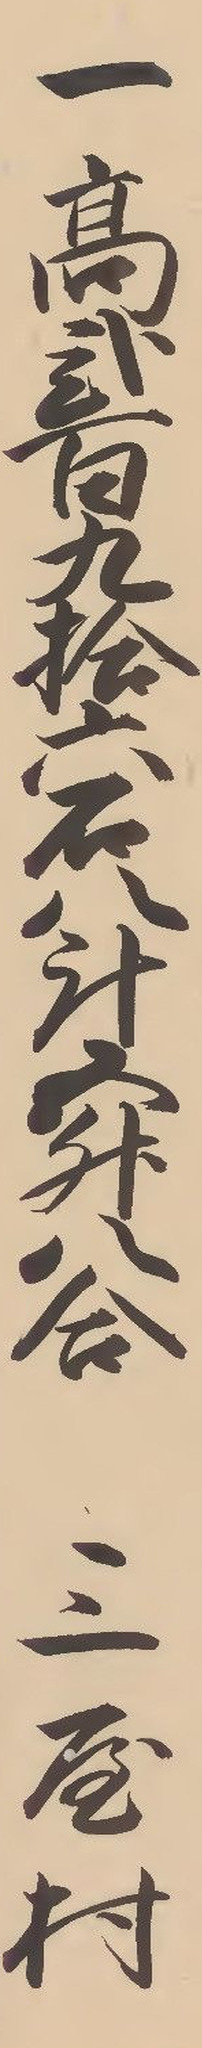一高弐百九拾六石八斗五升八合三屋村
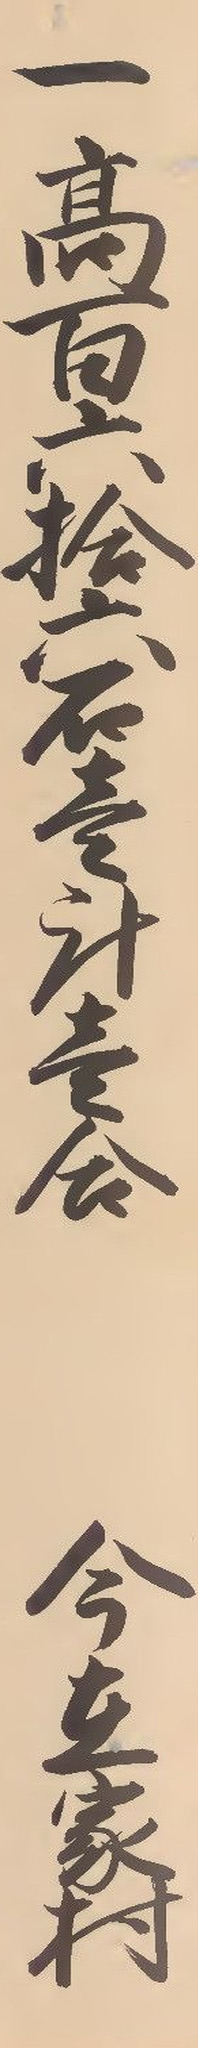一高百六拾六石壱斗壱合今在家村
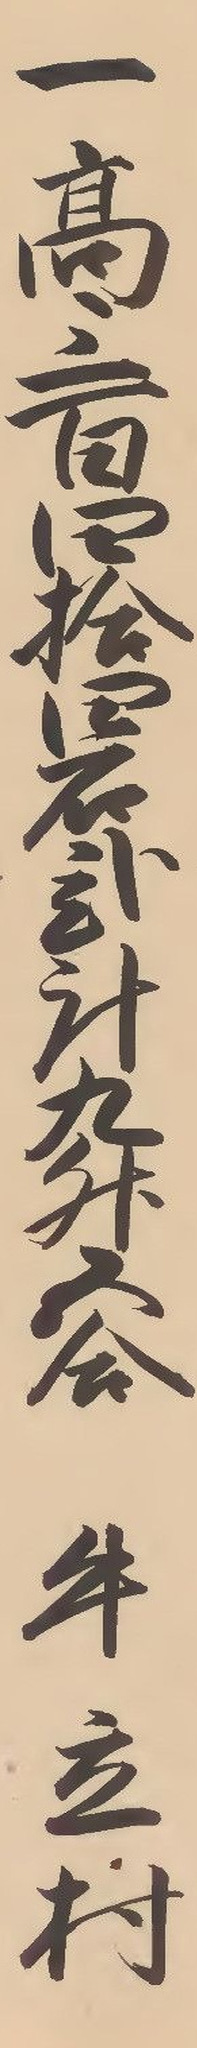一高三百四拾四石弐斗九升五合牛立村
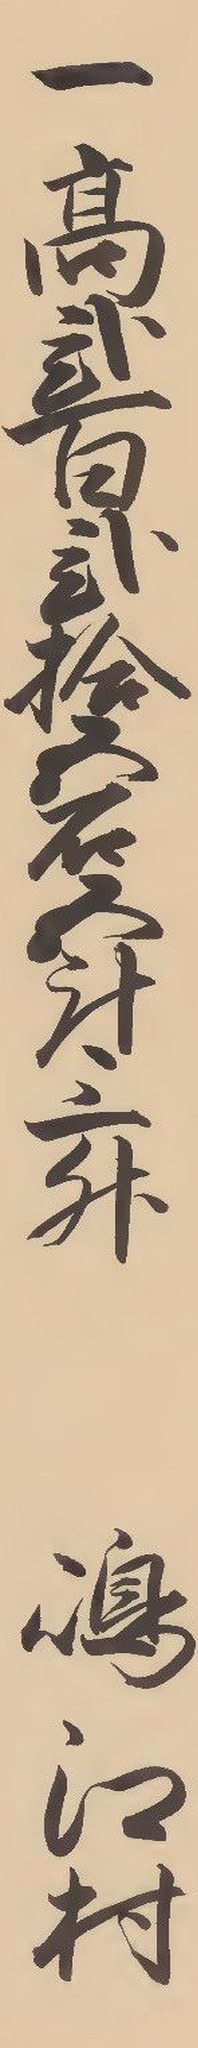一高弐百弐拾五石五斗三升島江村
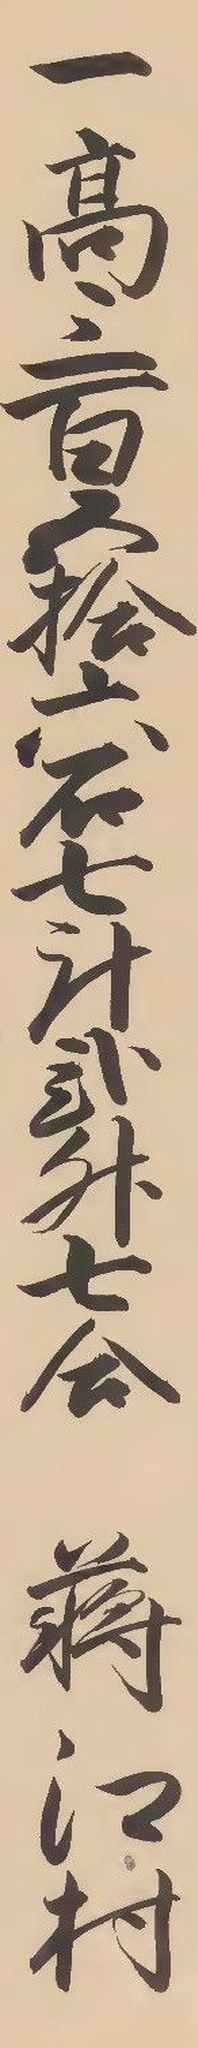一高三百五拾六石七斗弐升七合蒋江村

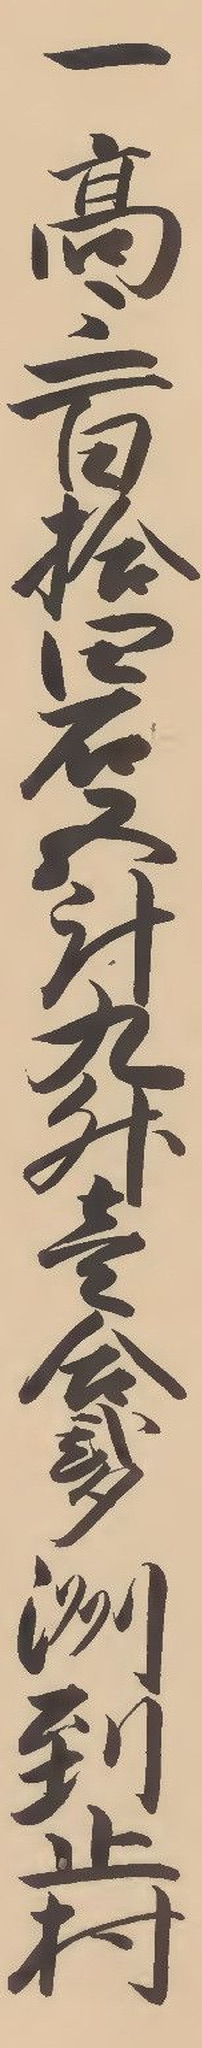一高三百拾四石五斗九升壱合弐勺洲到止村
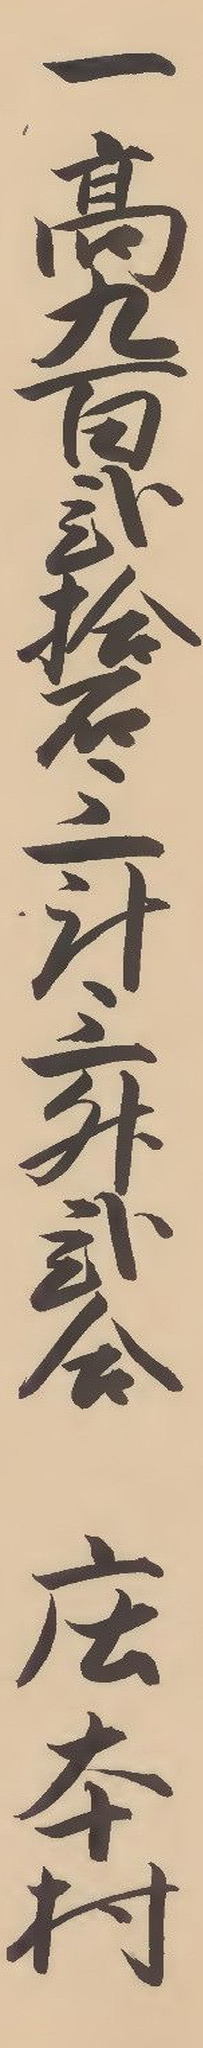一高九百弐拾石三斗三升弐合庄本村
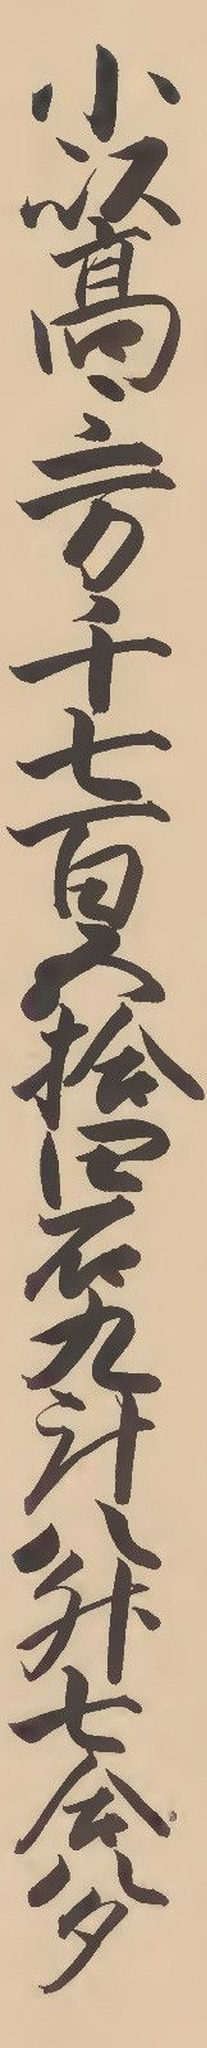小以高三万千七百五拾四石九斗八升七合八勺
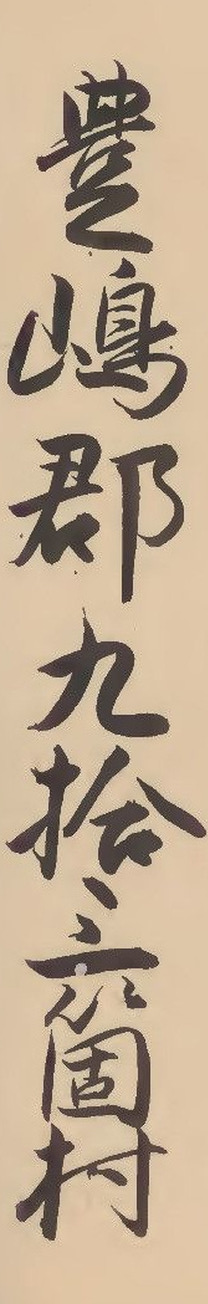豊島郡九拾三箇村
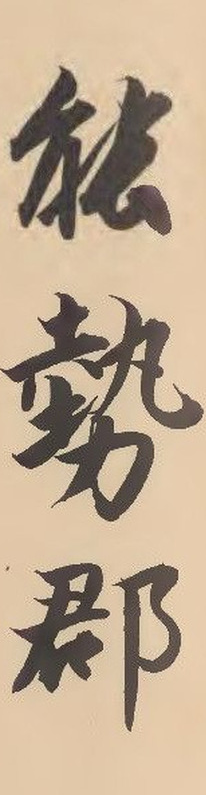能勢郡
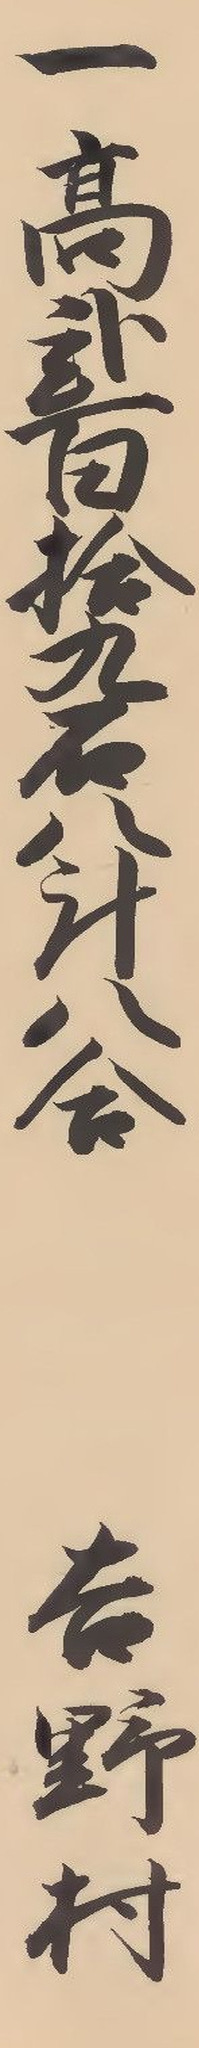一高弐百拾九石八斗八合吉野村
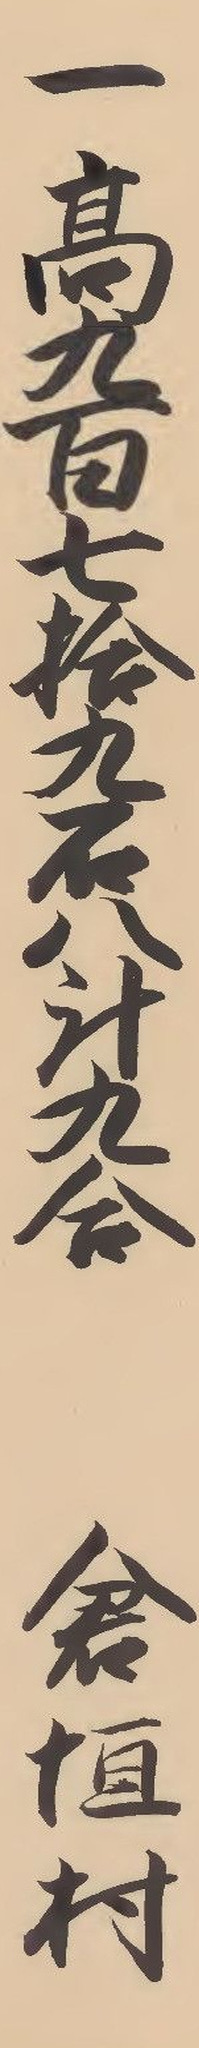一高九百七拾九石八斗九合倉垣村
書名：摂津国郷帳
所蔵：国立公文書館 National Archives of Japan
